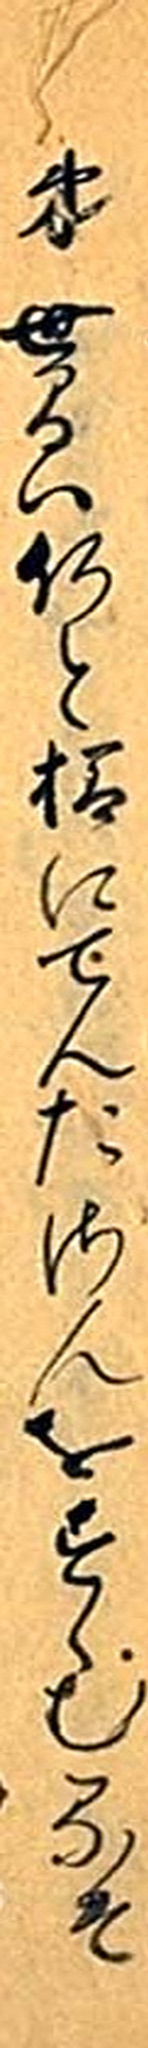弟世間は何と様にてんたさんをすゝむるそ
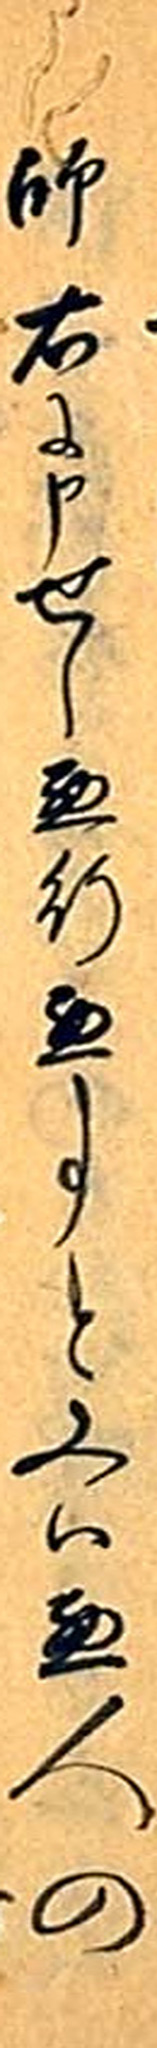師右に申せし悪行悪事と又は悪人の
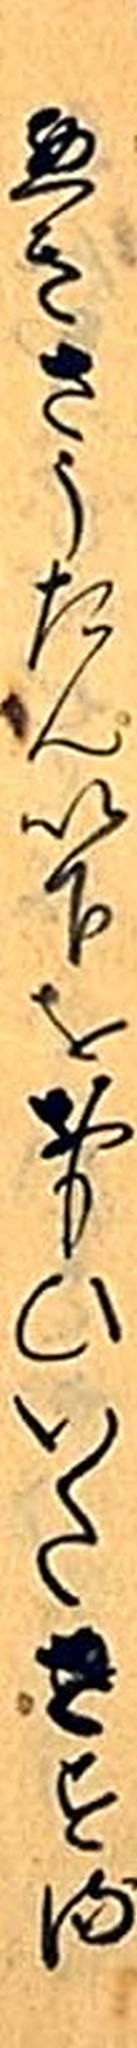悪きさうたん以下をおもひいたさする
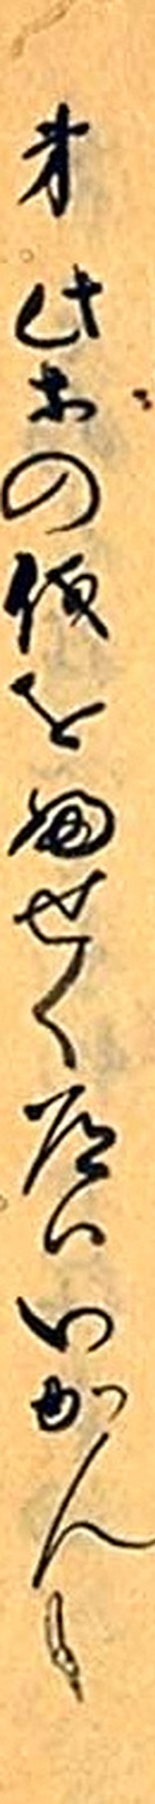弟此等の儀をふせく道はいかん
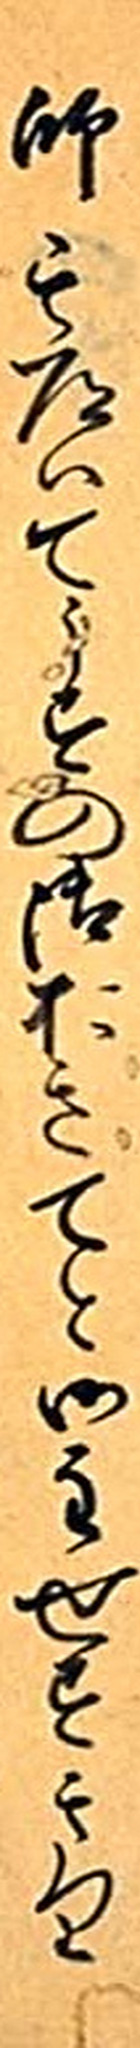師其道はてうすの御おきてと御主せすきり
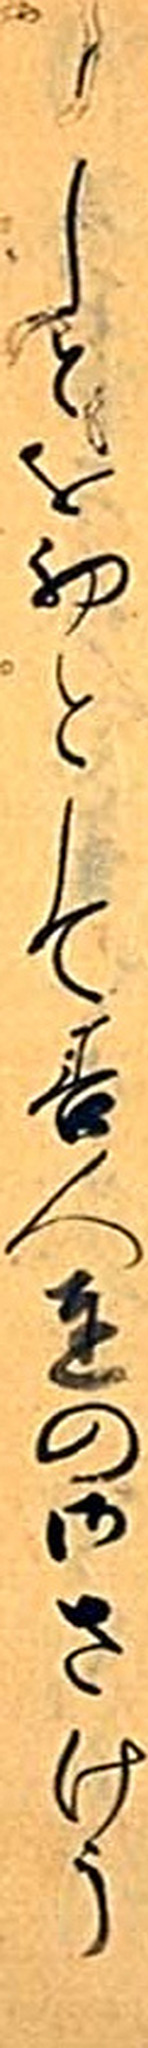しとを初として善人達の御さけう
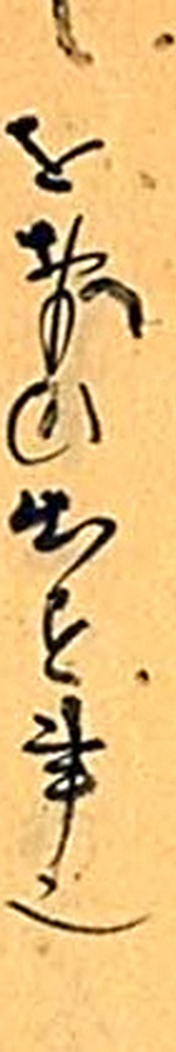をおもひ出す事也
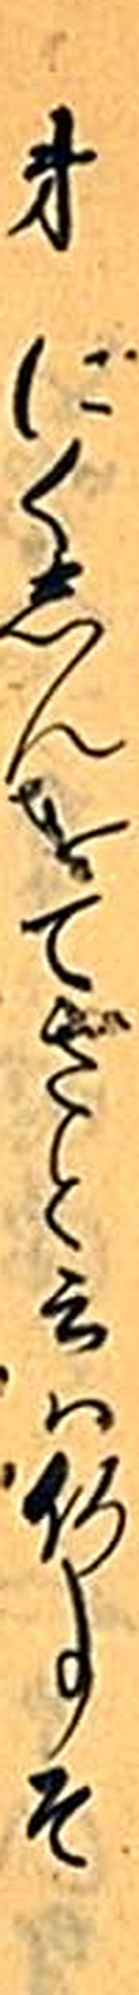弟にくしんをてきと云は何事そ
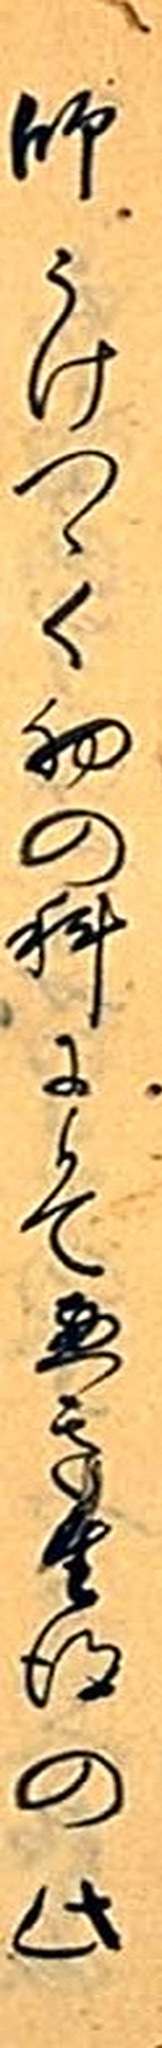師うけつゝく初の科によて悪き生得の此
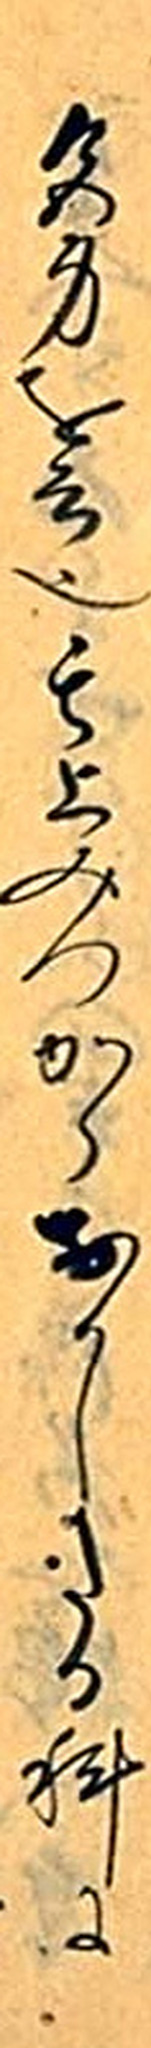色身を云也其上みつからおかしたる科に
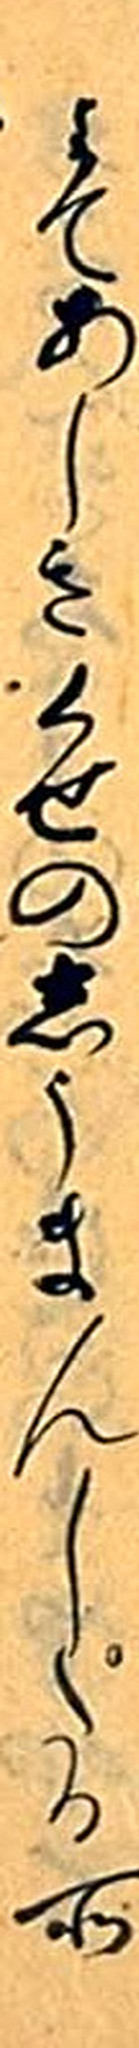よてあしきくせのしうまんしたる所
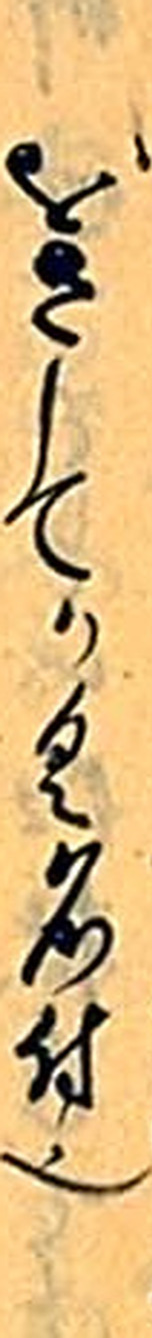をさしてかく名付也
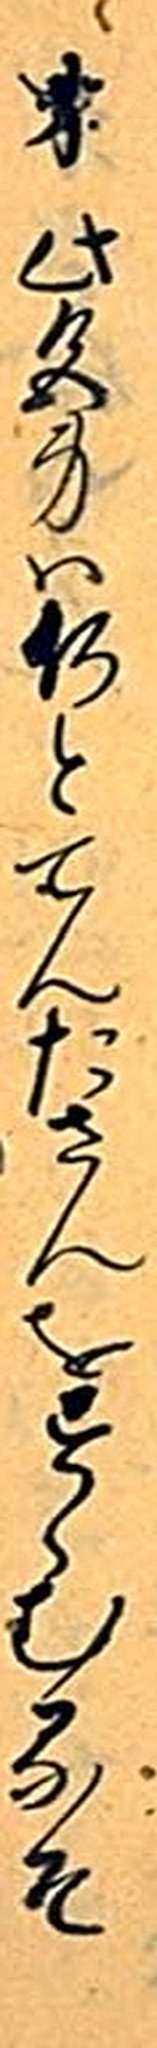弟此色身は何とてんたさんをすゝむるそ
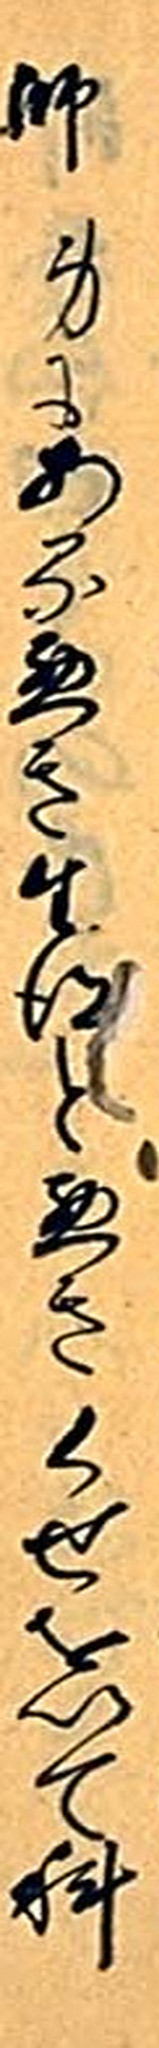師身にある悪き生得と悪きくせを以て科
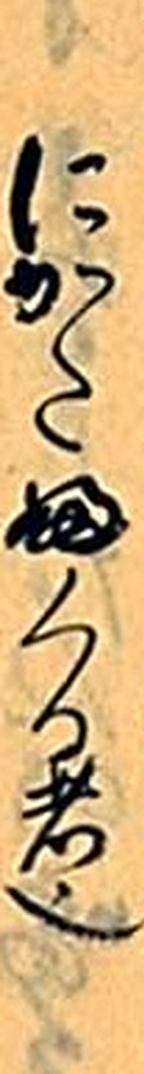にかたふくる者也
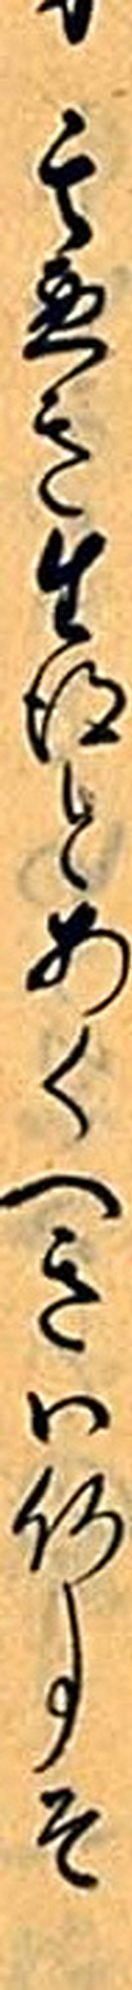弟其悪き生得とあくへきは何事そ
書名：ドチリナ・キリシタン
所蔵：東京大学総合図書館 / General Library in the University of Tokyo
